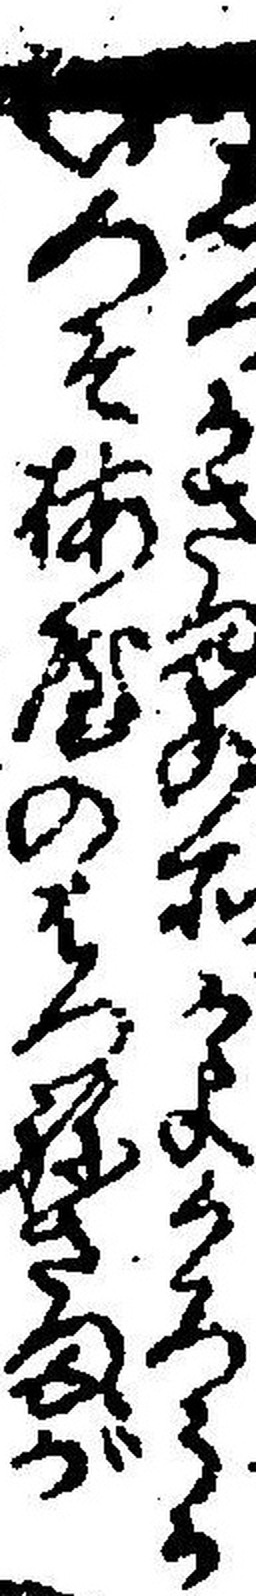いつそ梅屋のはつねさまが
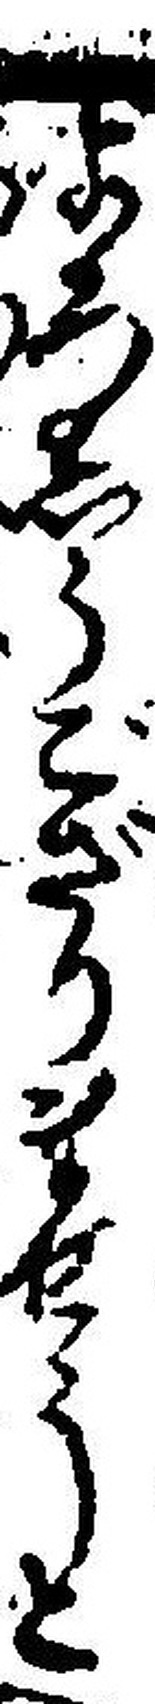よろしうござりませうと
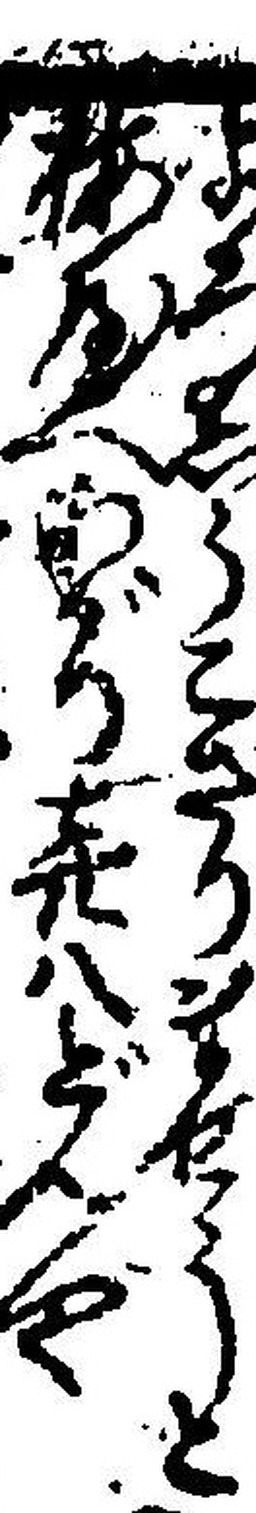梅屋へあがり喜八どんや
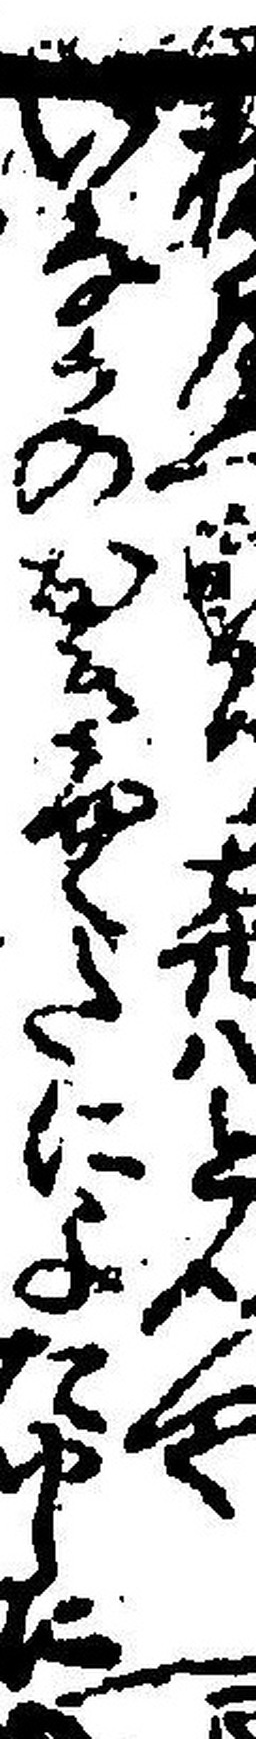いなかのおきやくたによたいしに
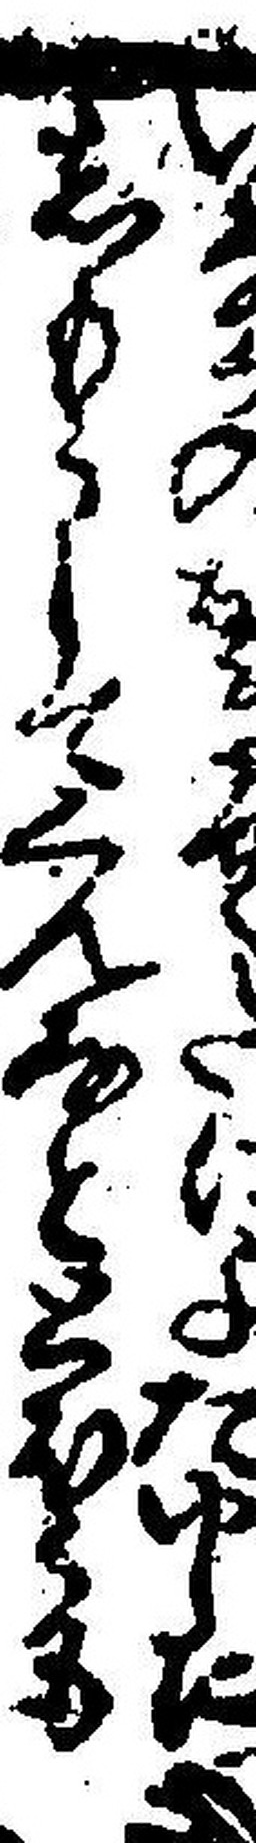しもうしてくんなととほうも
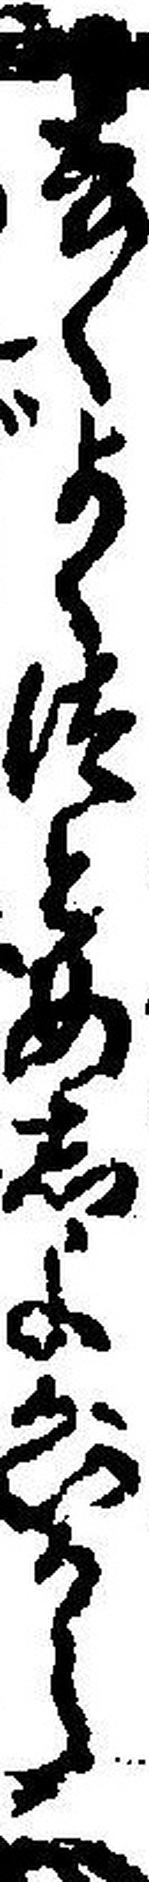なくよくつとめしよかいから
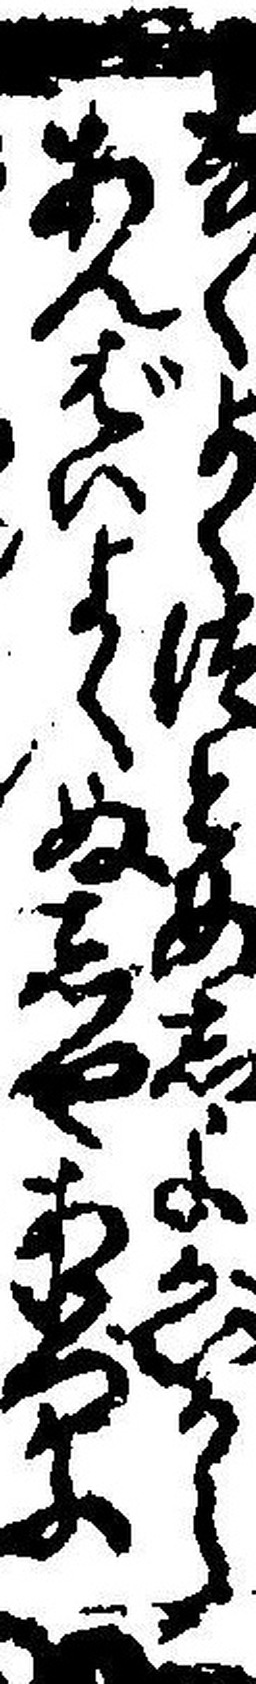あんばいよくぬしやあいつかふ
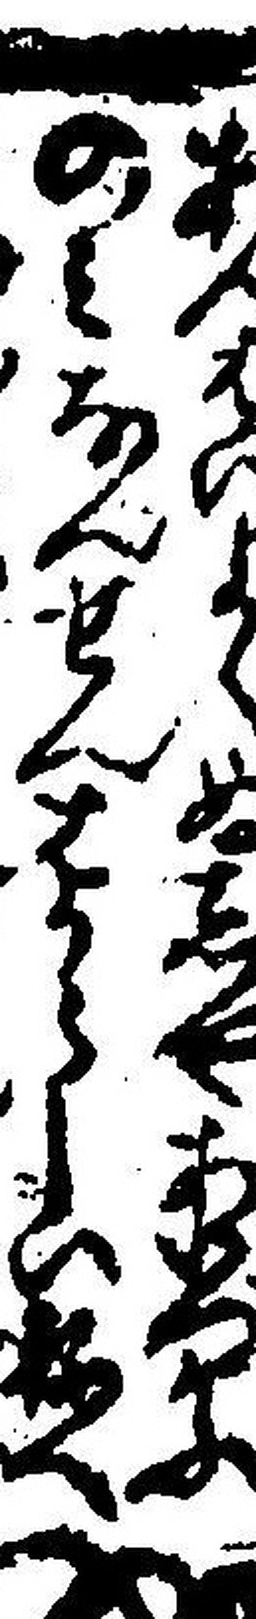のみなんせんはからしいねへ
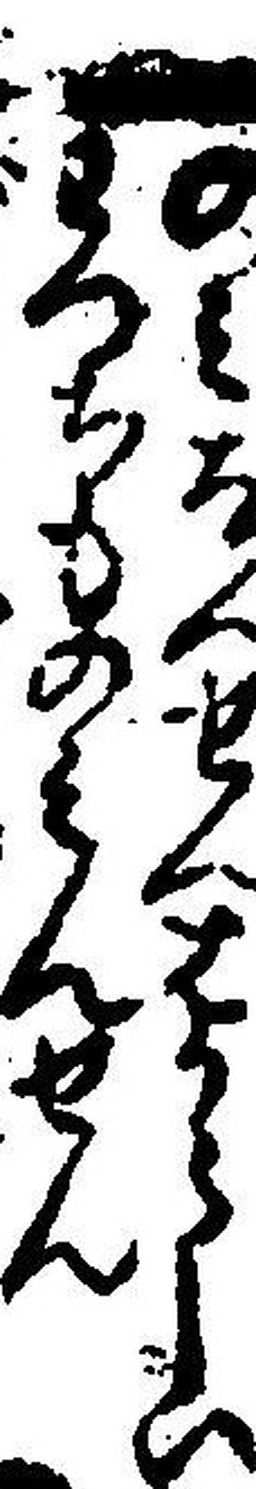わつちものみんせん
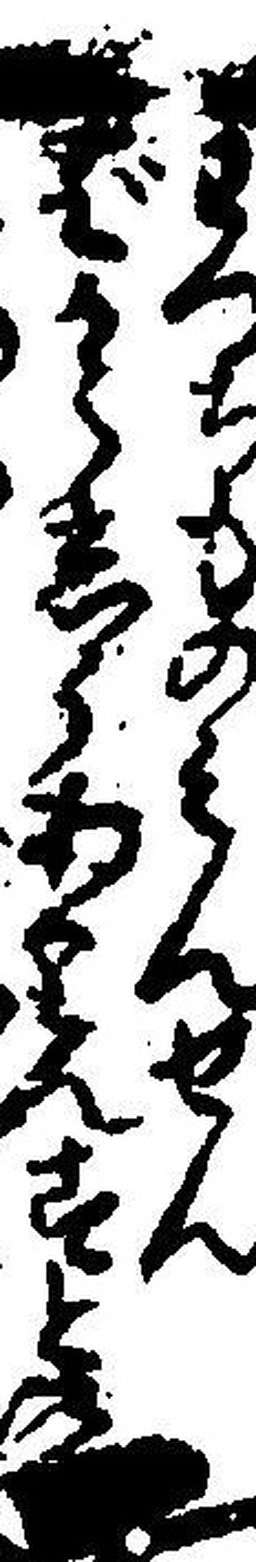ばからしうありんすと
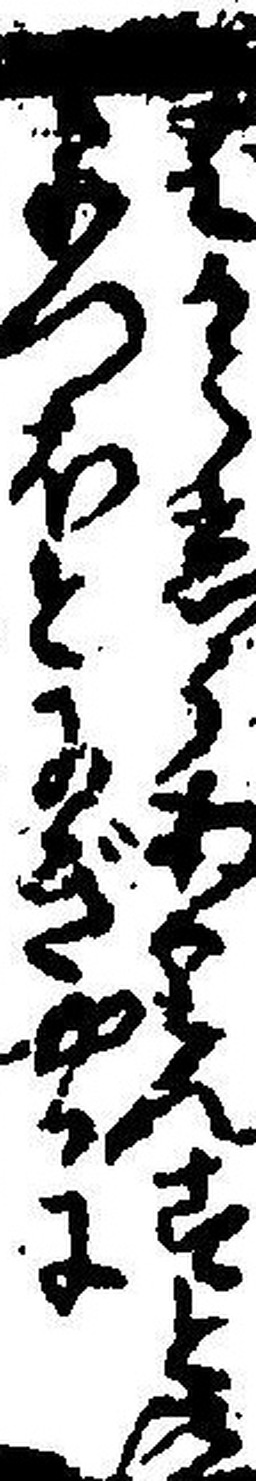よつほとにぎやかに
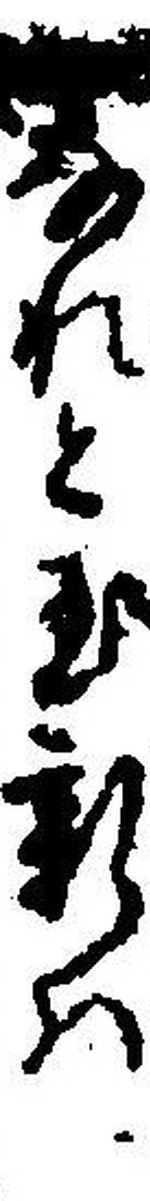なれと玉新は
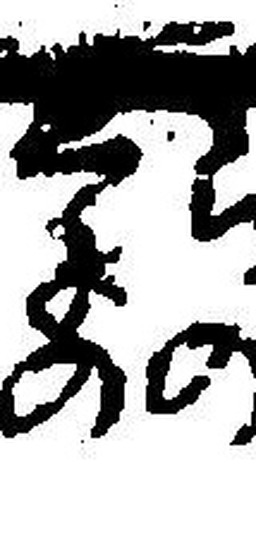くにの
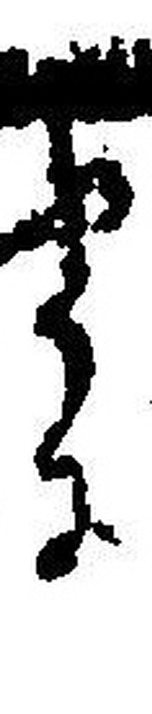ふうに
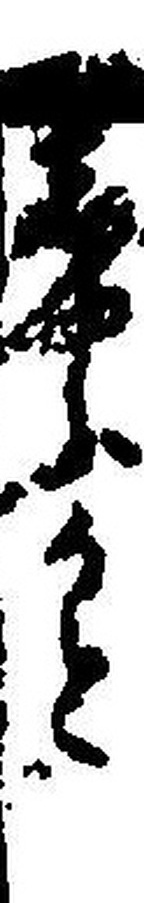しやふかと
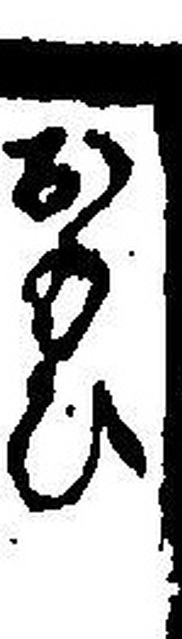おもひ
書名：間違狐之女郎買 / 市場通笑作
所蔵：東京大学総合図書館 General Library in the University of Tokyo, JAPAN
